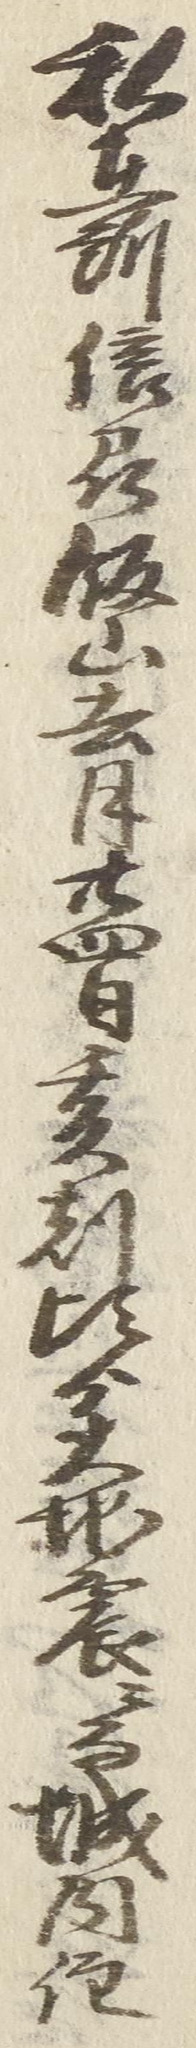私在所信州飯山去月廿四日亥刻頃ゟ大地震二而城内住
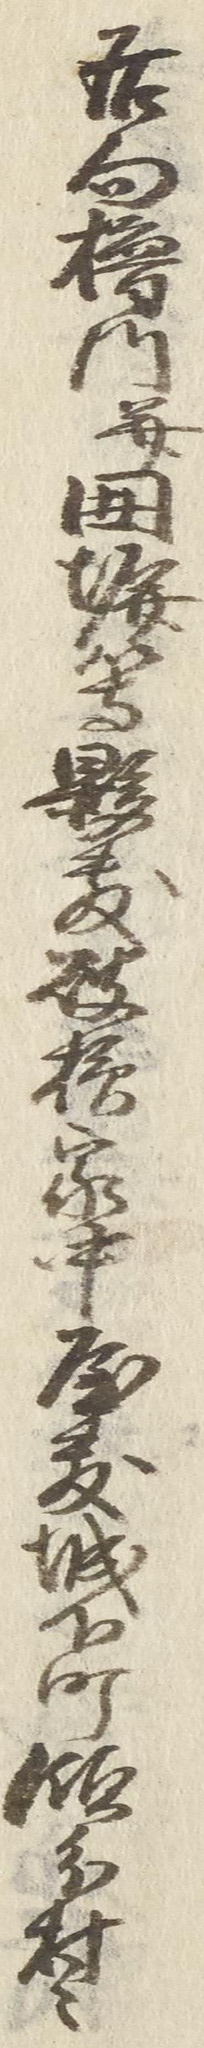居向門并囲塀等夥敷破損家中屋敷城下町領分村々
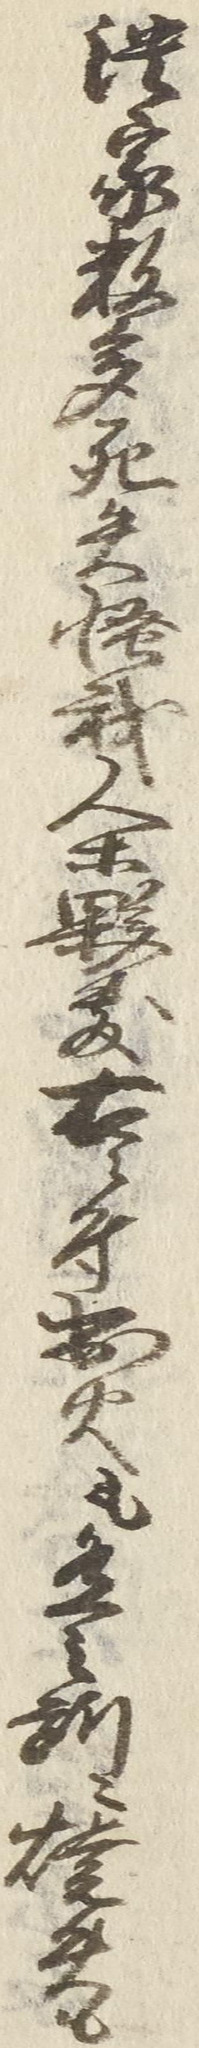潰家数多死失怪我人等夥敷く右二付出火も有之所々焼失も
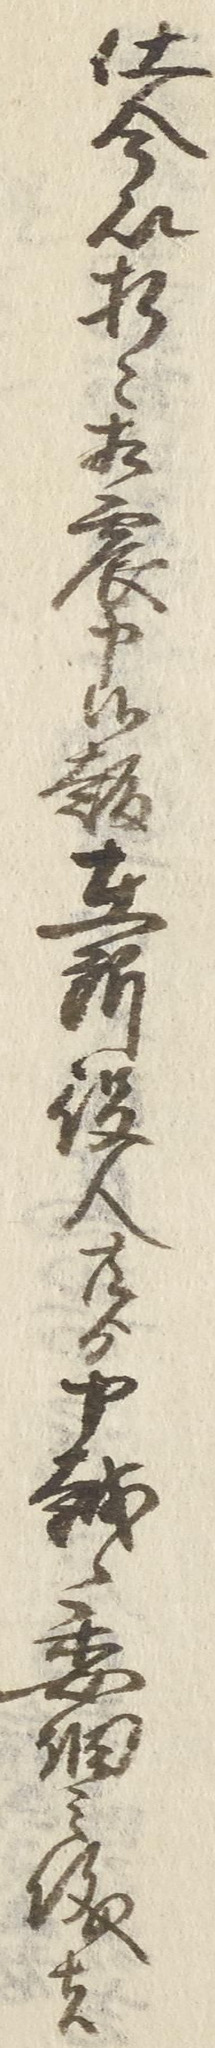仕今以折々相震申候趣在所役人共ゟ申越候委細之儀は
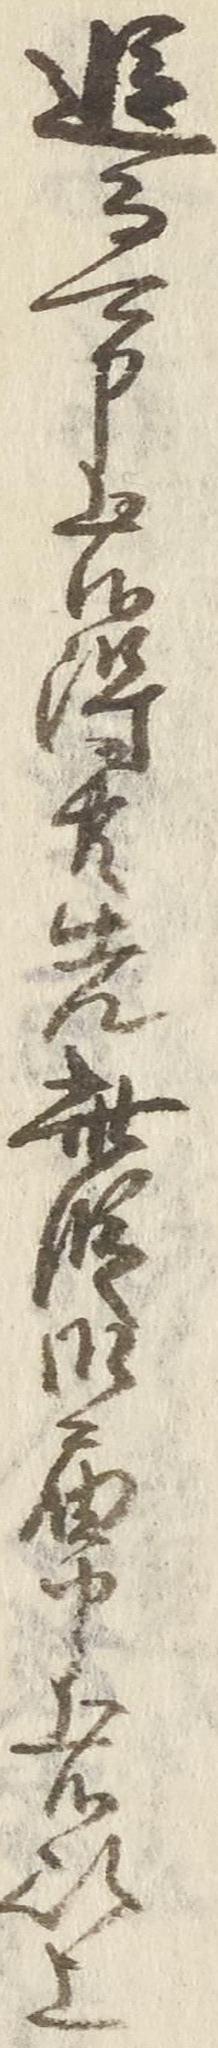追而可申上候得共先此段御届申上候以上
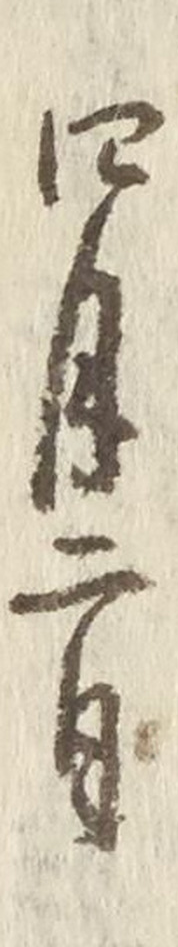四月二日
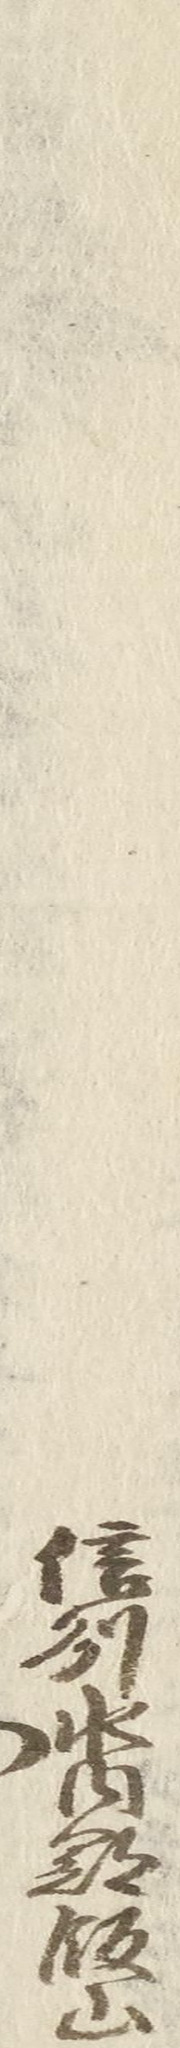信州水内郡飯山
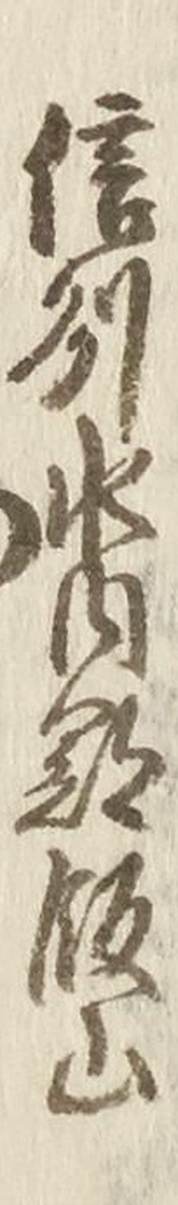信州水内郡飯山
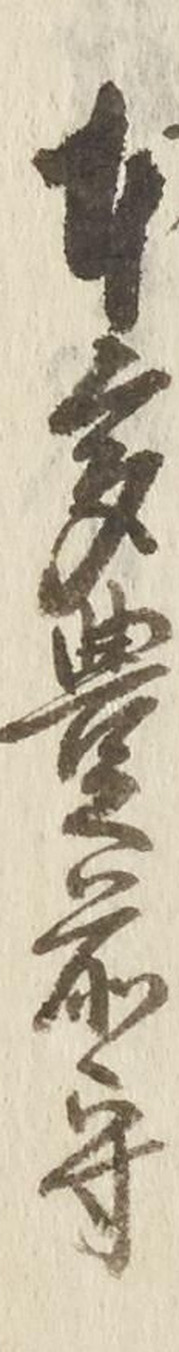本多豊前守
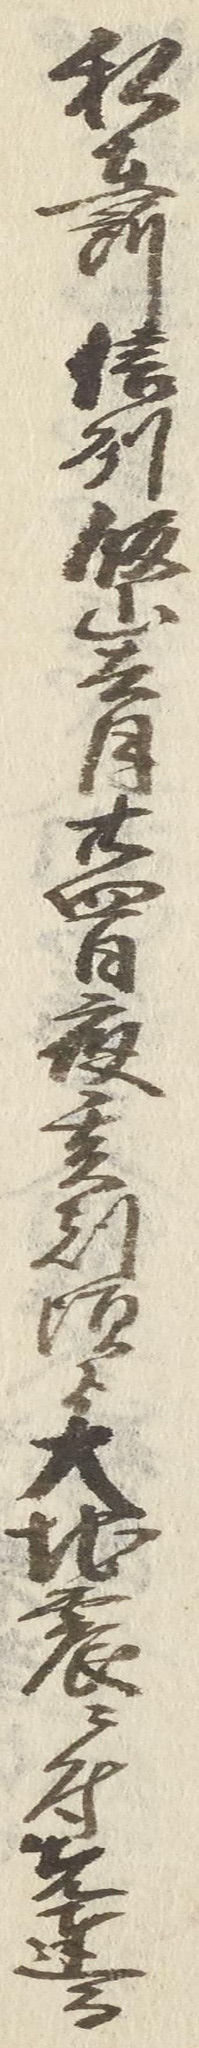私在所信州飯山去月廿四日夜亥刻頃ゟ大地震二付先達而
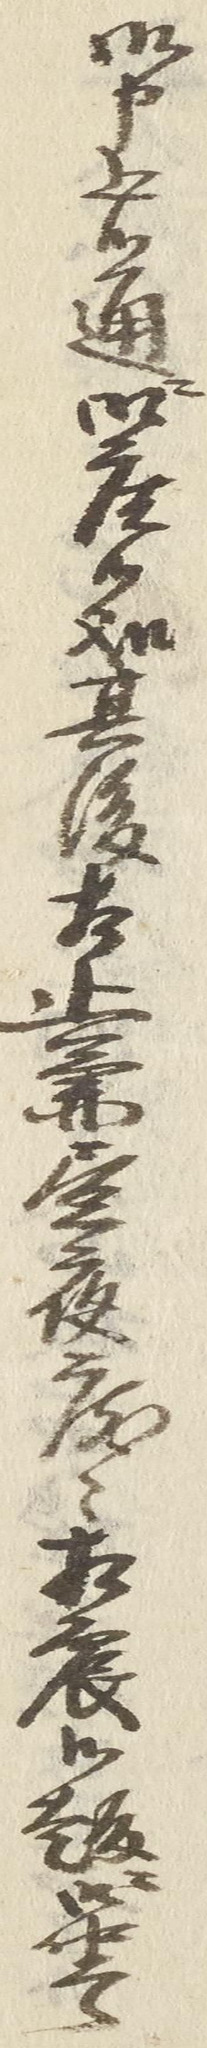御申上候通二御座候処其後相止兼昼夜度々相震候趣二御座候
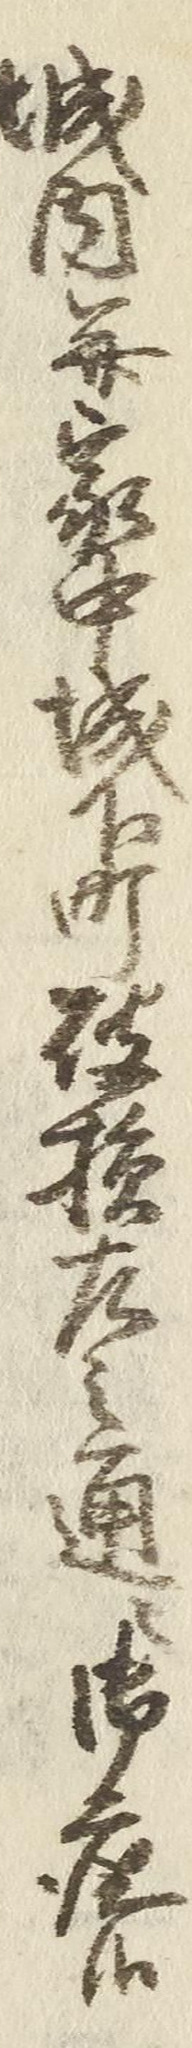城内并家中城下町破損左之通二御座候
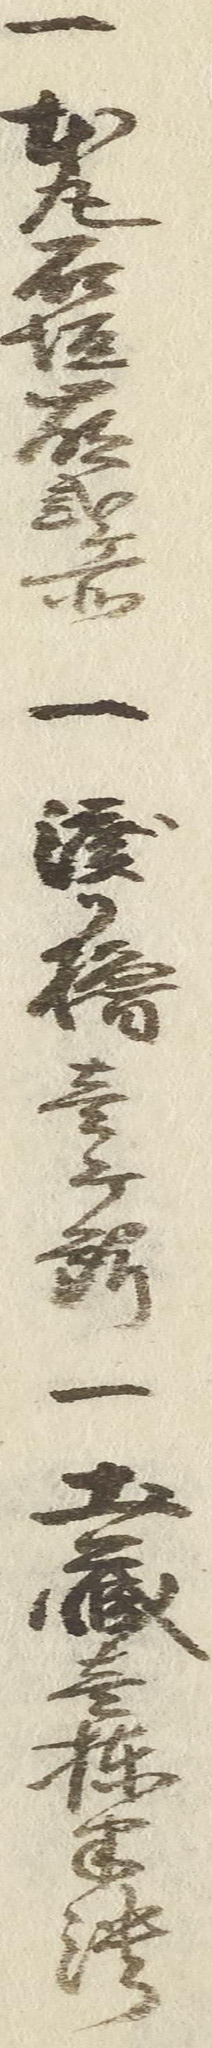一本丸石垣通崩弐ヶ所一渡り櫓壱ヶ所一一土蔵壱棟半潰
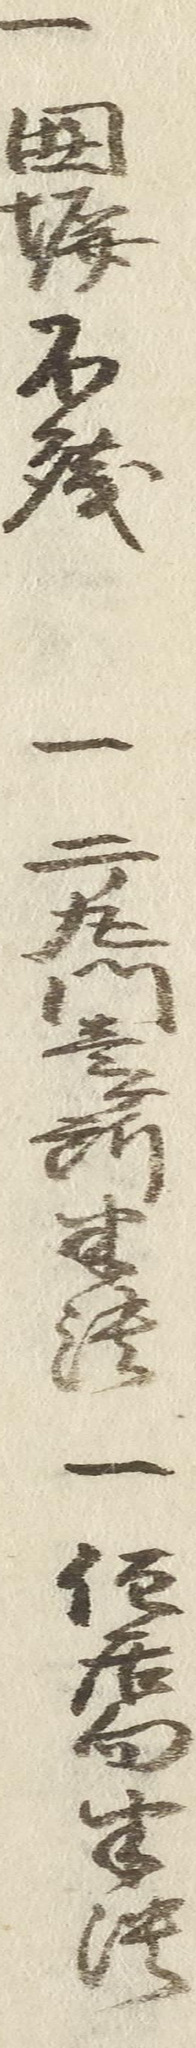一囲塀不残一二ノ丸門壱ヶ所半一住居向半潰
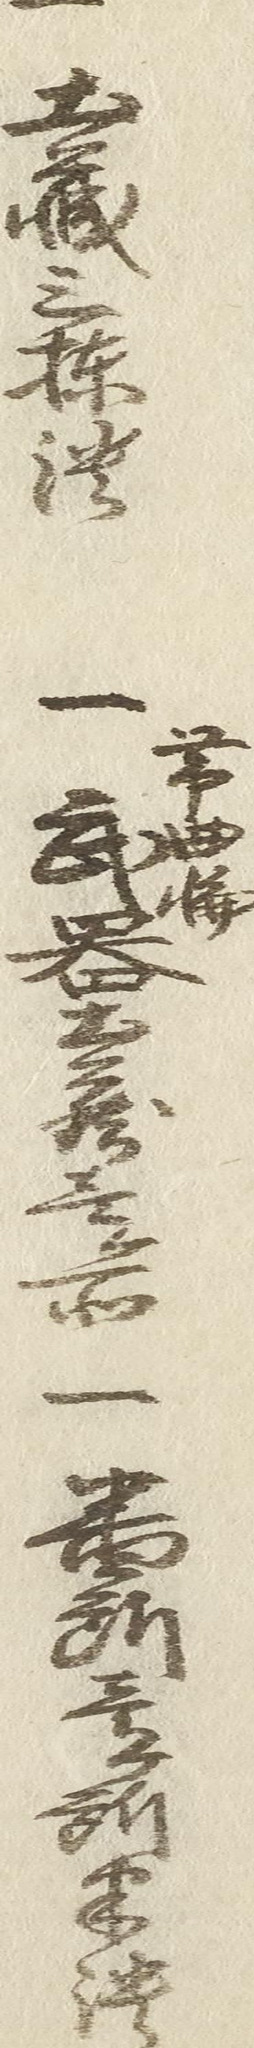一土蔵三棟潰一帯曲輪武器土蔵壱ヶ所一番所壱ヶ所半潰
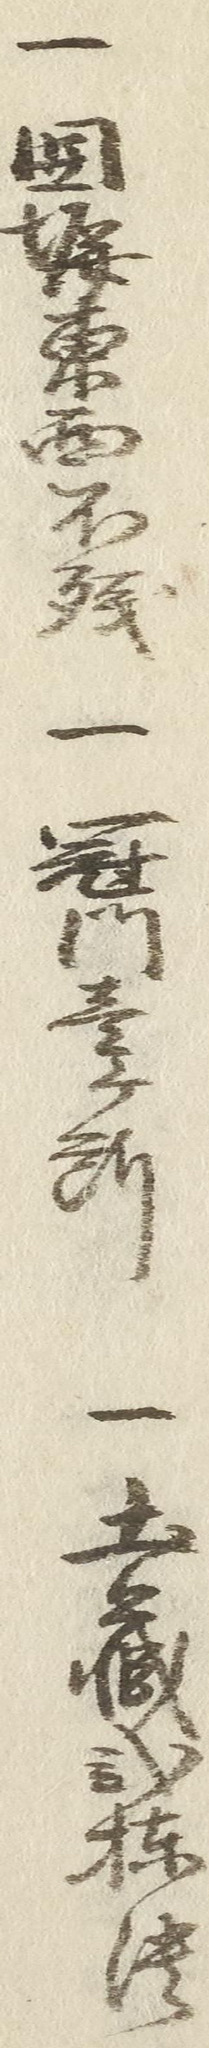一囲塀東西不残一冠門壱ヶ所一土蔵弐棟潰
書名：従往古地震御届書記誌之一
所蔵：東京大学地震研究所図書室 Earthquake Research Institute Library, The University of Tokyo, JAPAN
